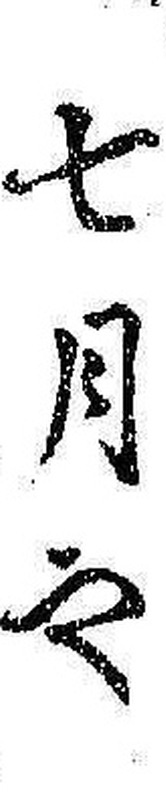七月や
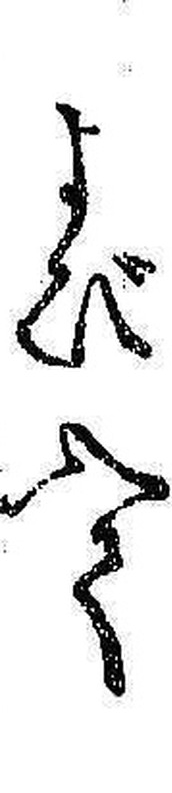よび入て
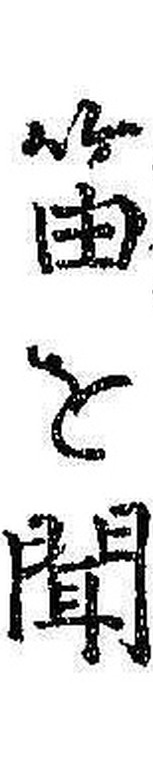笛を聞
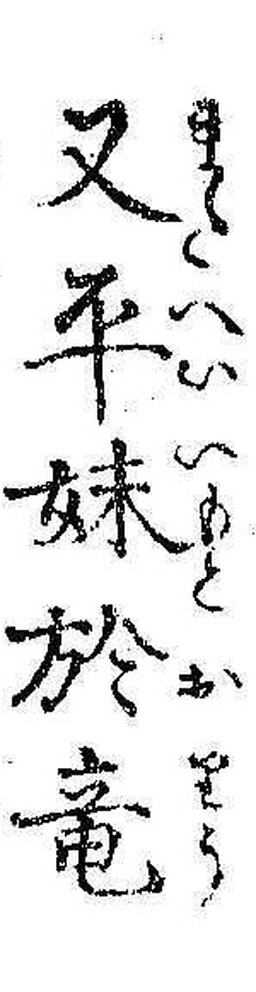又平妹於竜
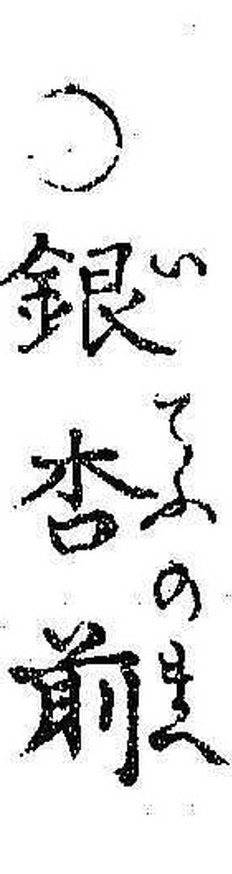○銀杏前
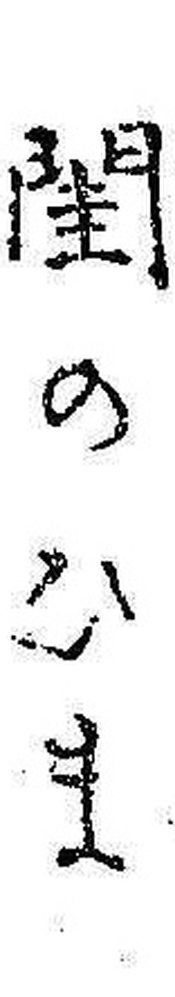閨のひま

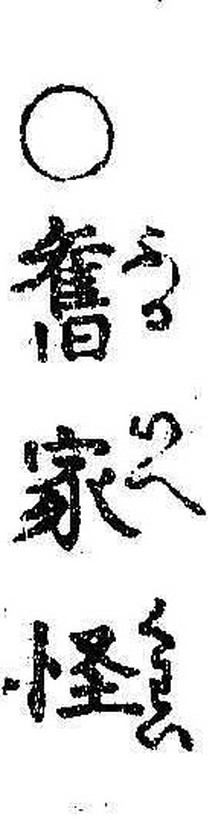○旧家怪
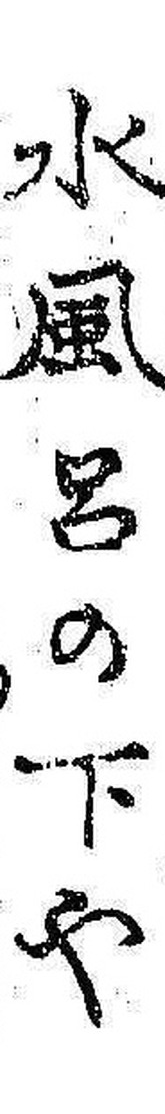水風呂の下や
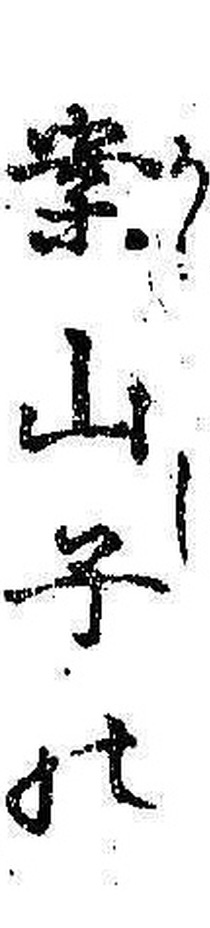案山子の
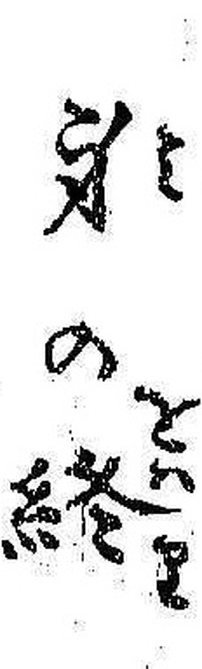身の終
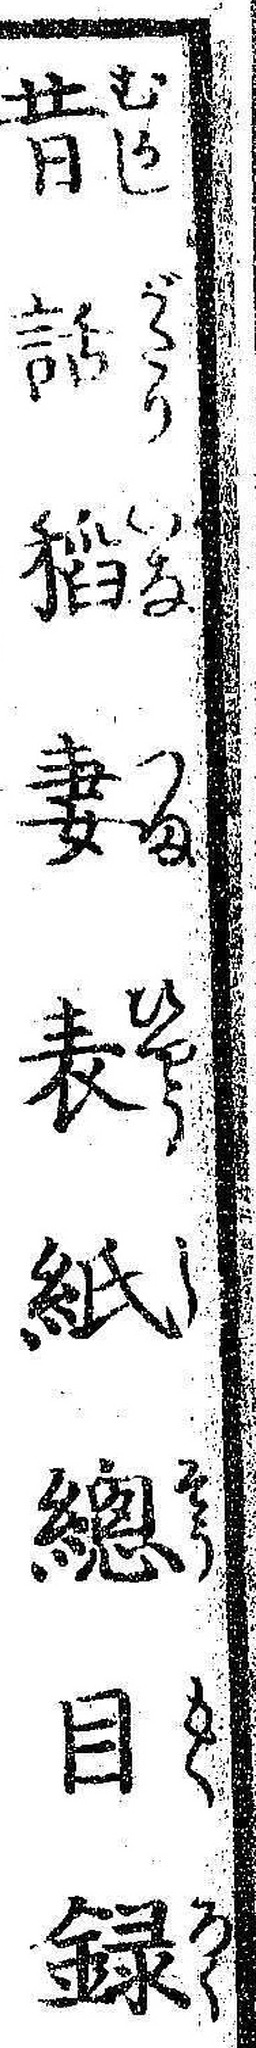昔話稲妻表紙総目録
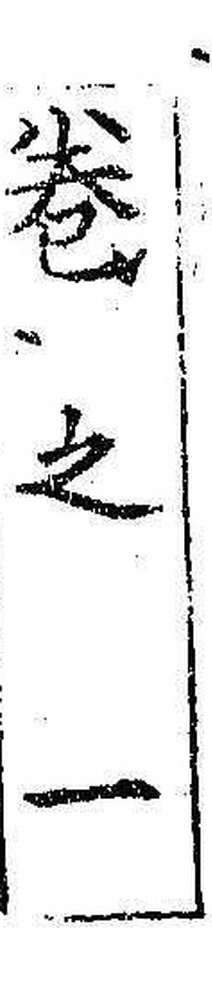巻之一
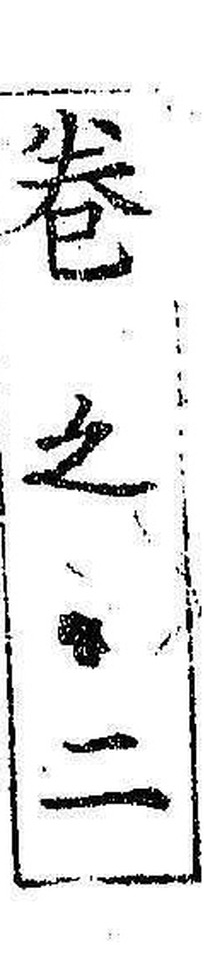巻之二
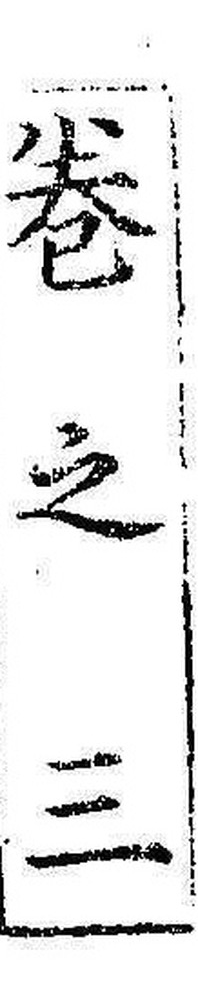巻之三

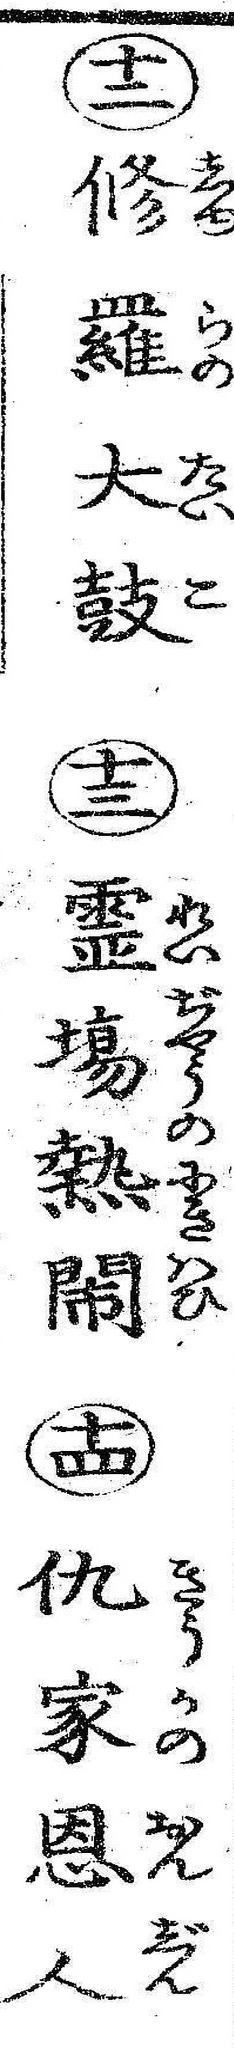十二修羅大鼓十三霊場熱閙十四仇家恩人
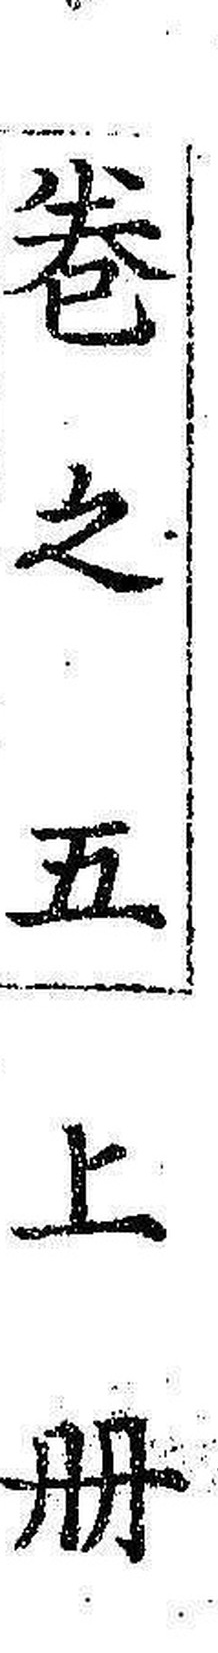巻之五上冊
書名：昔話稲妻表紙
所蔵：国文学研究資料館
